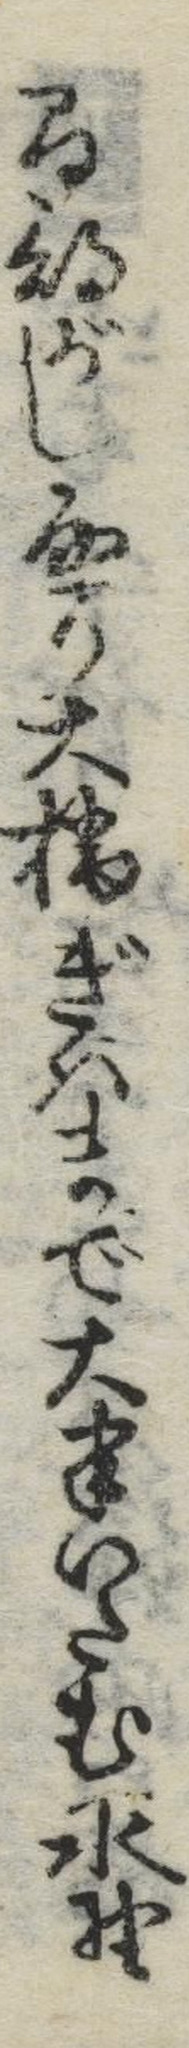間部がし通り大橋ぎハまで大半いたむ水野
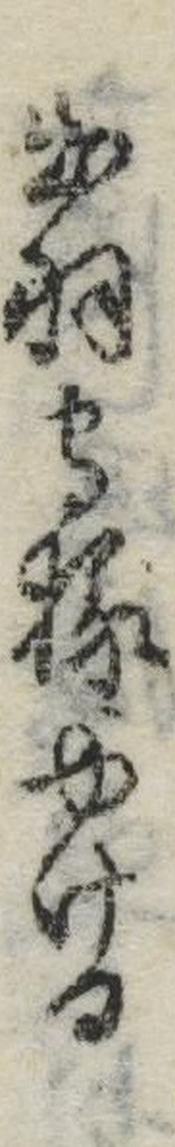出羽守様やける
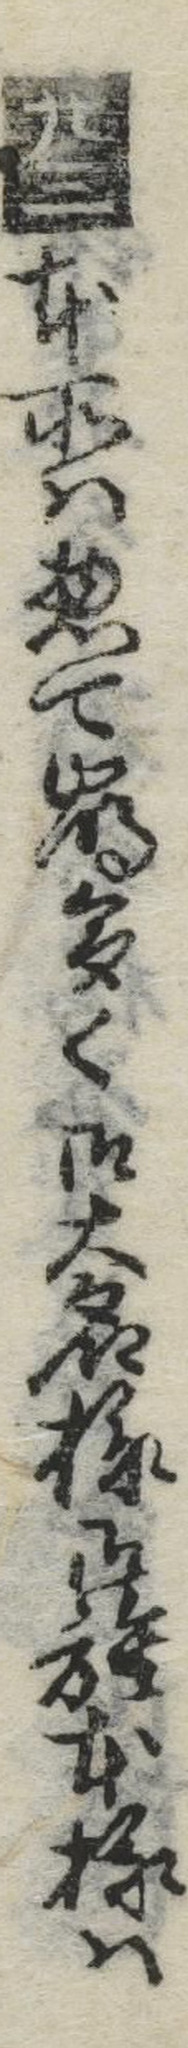廿三本所ハ惣て崩多く御大名様御旗本様ハ
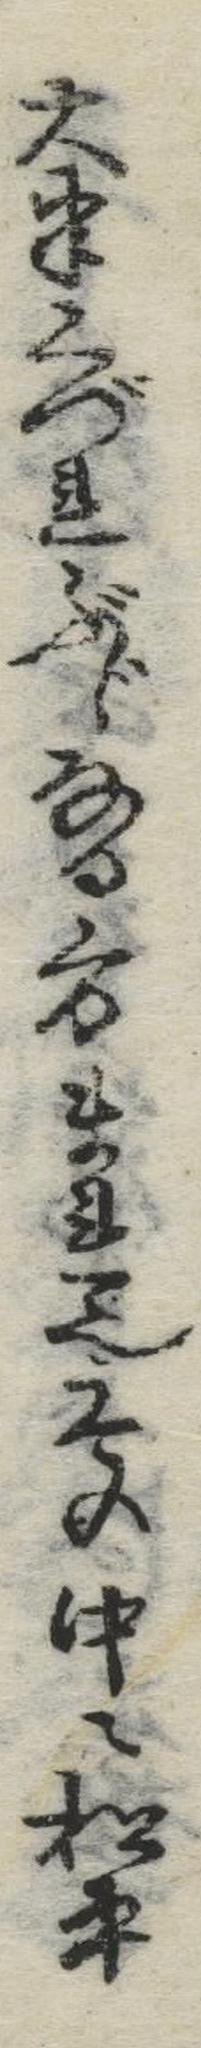大半くづれぶじなる方まれなりその中二松平
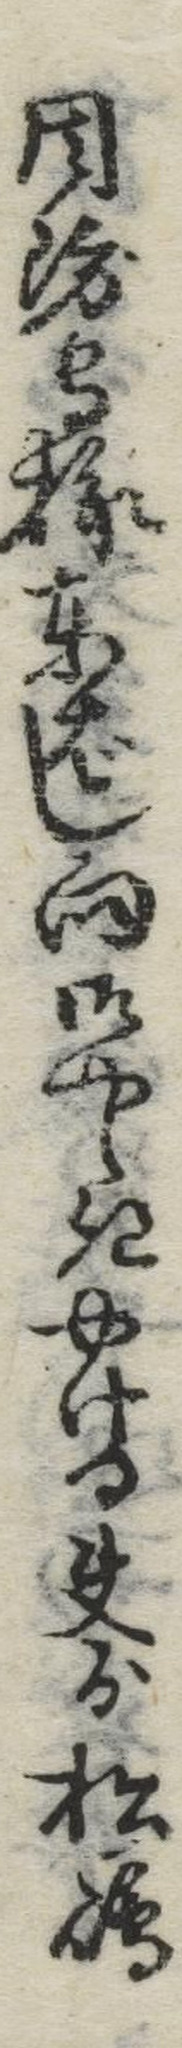周防守様東ばし向御やしきやける夫ゟ松嶋
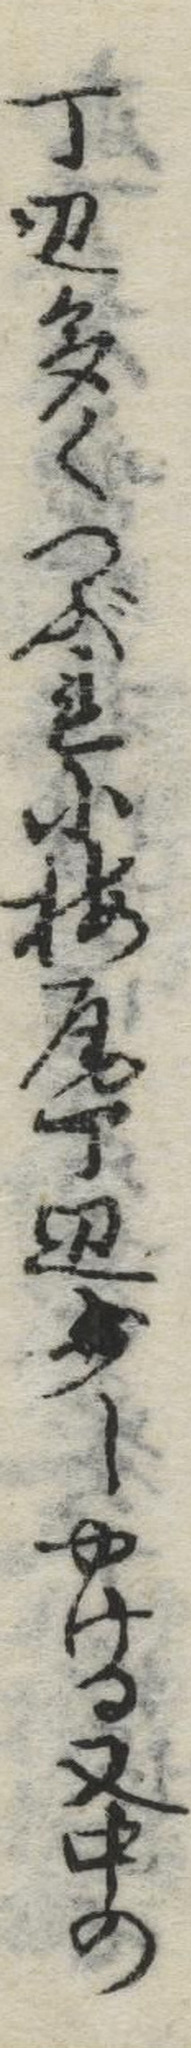丁辺多くつぶれ小梅瓦丁辺少しやける又中の
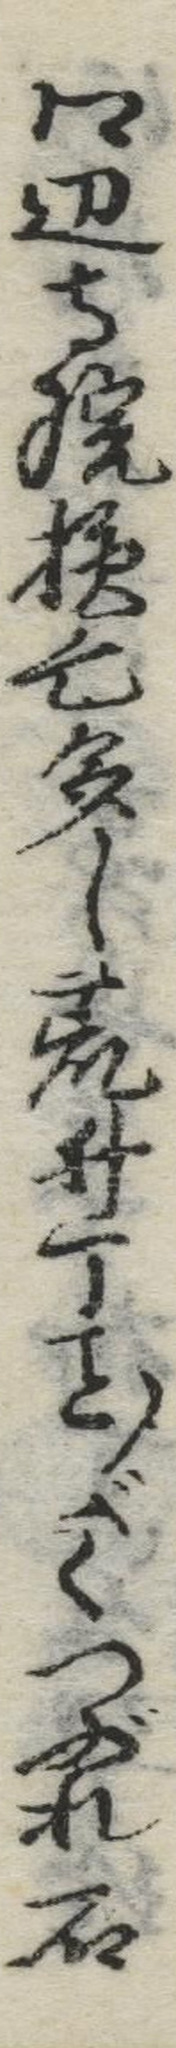郷辺寺院損亡多し荒井丁辺こと〴〵くつぶれ石
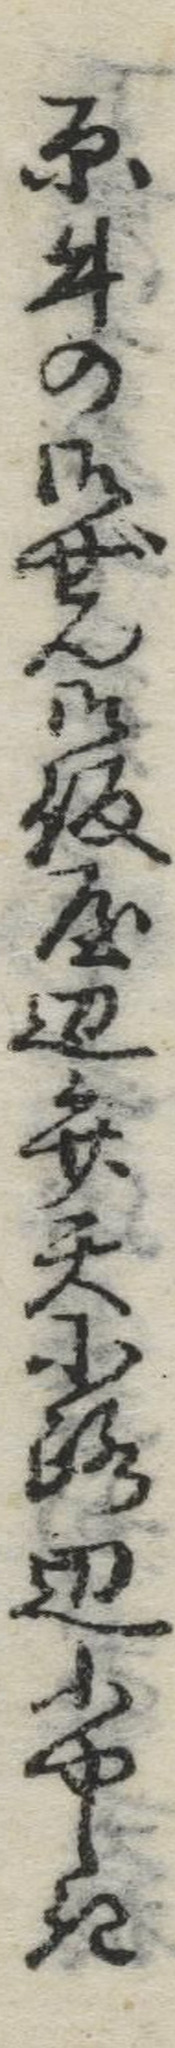原牛の御ぜん御仮屋辺弁天小路辺小やしき
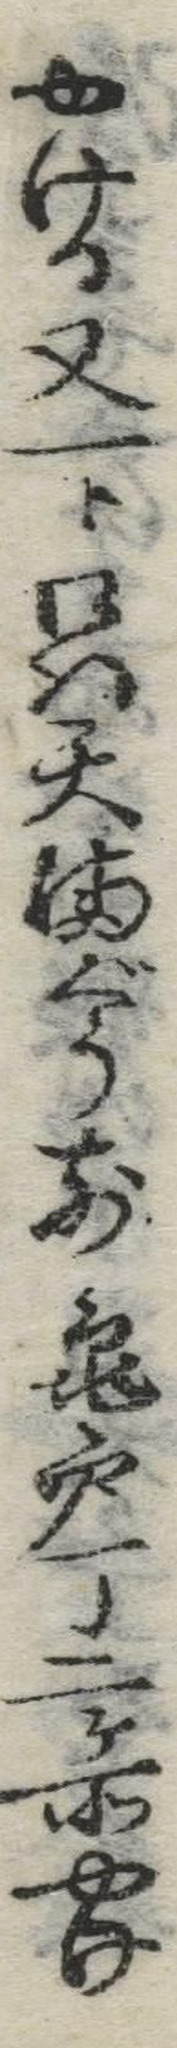やける又一ㇳ口ハ天満ぐう前亀戸丁二ヶ所やけ
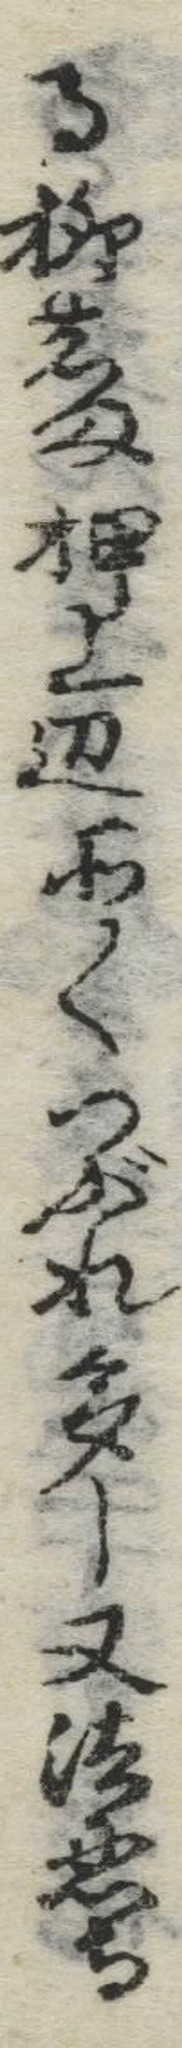る柳しま押上辺所々つぶれ多し又法忍寺
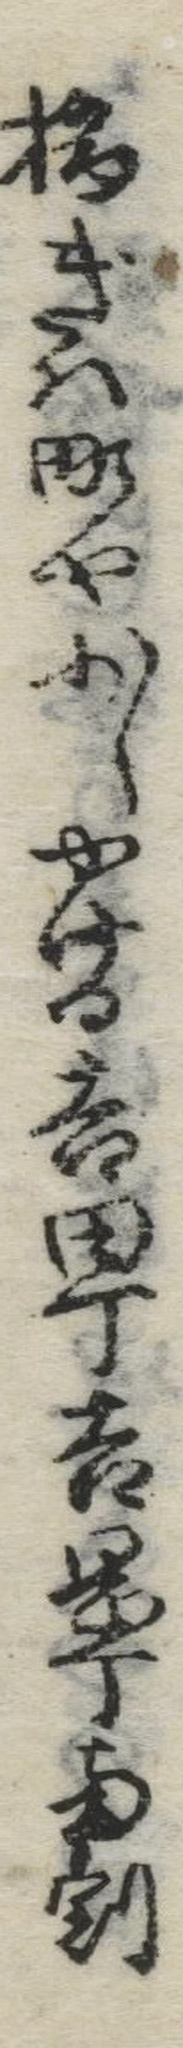橋際町や少しやける吉田丁吉岡丁南割
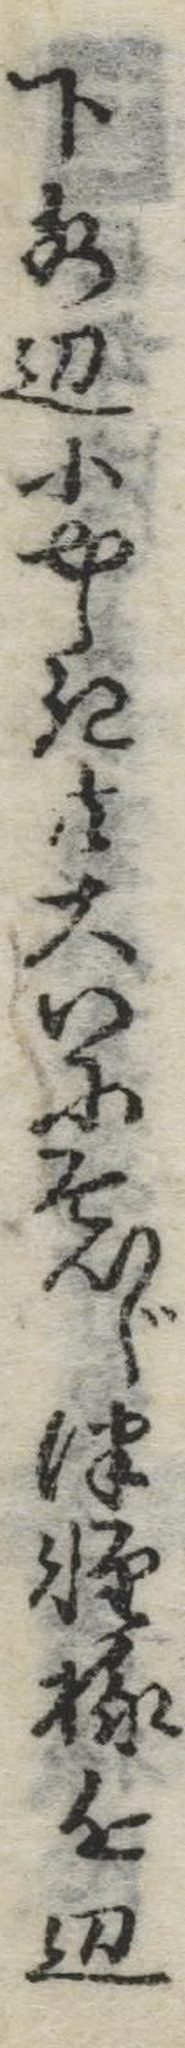下水辺小やしき大いにそんじ津軽様近辺
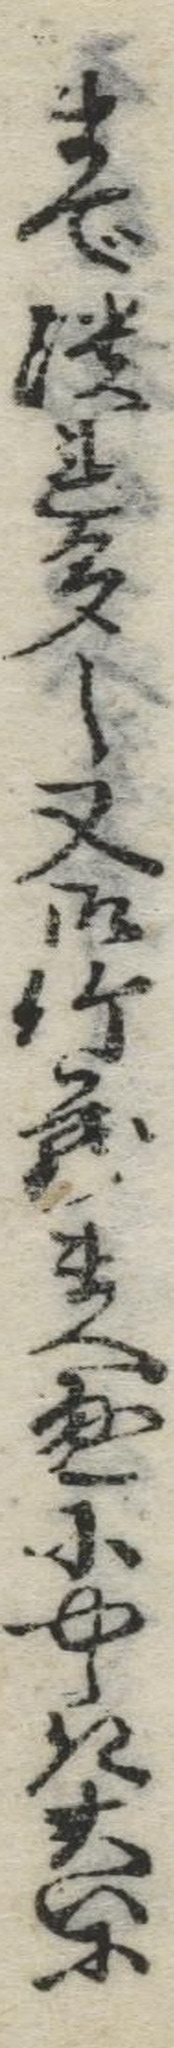まで潰れ多し又御竹蔵まへ通小やしき大いに
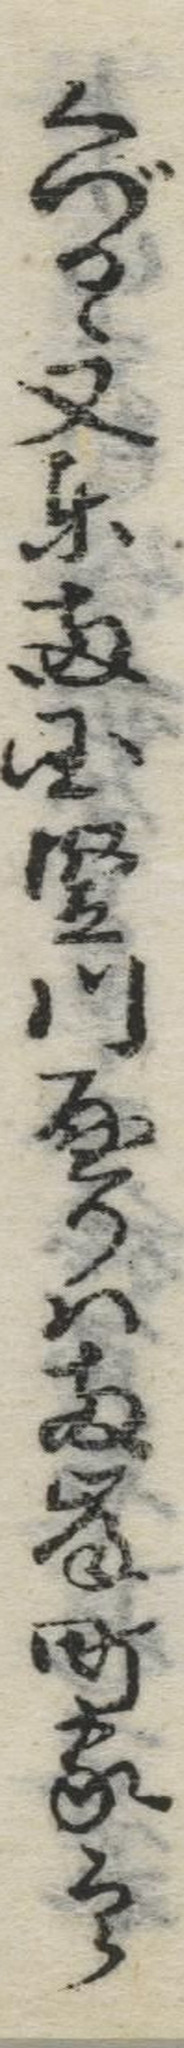くづるゝ又東両国堅川通りハ両岸町家うら
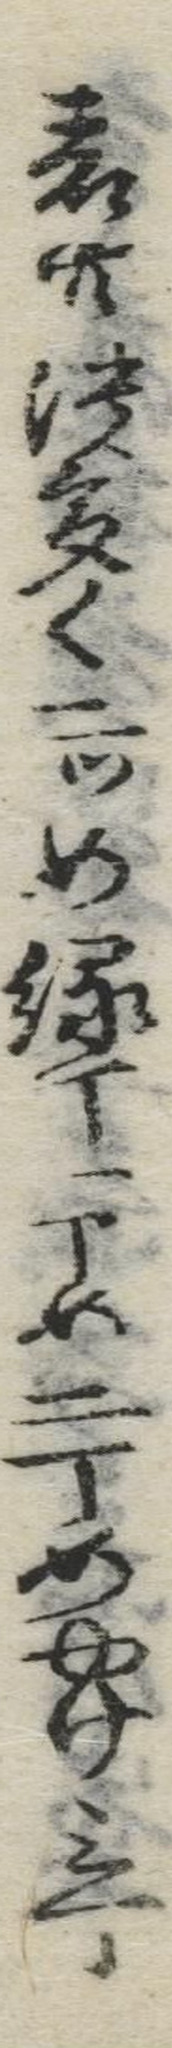表共潰多く二ッめ緑丁一丁め二丁めやけ三丁
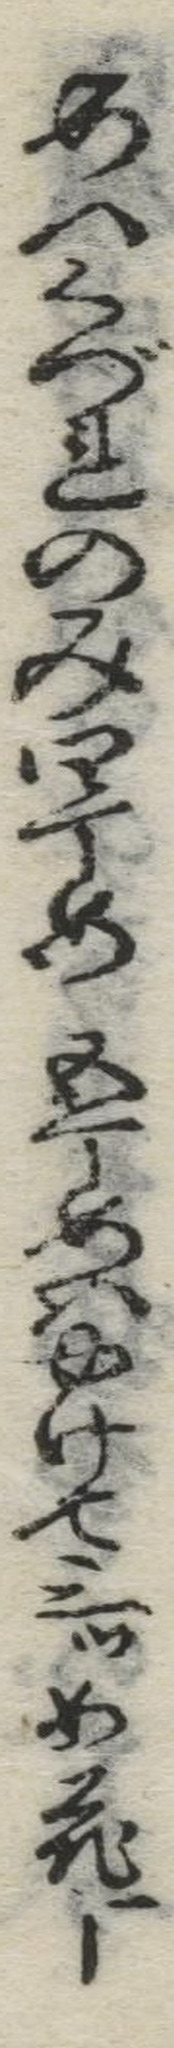めハくづれのミ四丁め五丁めハやけて三ッめ花丁
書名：安政二卯十月二日夜四ツ時過　御府内御屋敷方市中共　地震類焼場所明細書之寫　并街道筋近郷聞書
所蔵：東京大学地震研究所図書室 Earthquake Research Institute Library, The University of Tokyo, JAPAN
